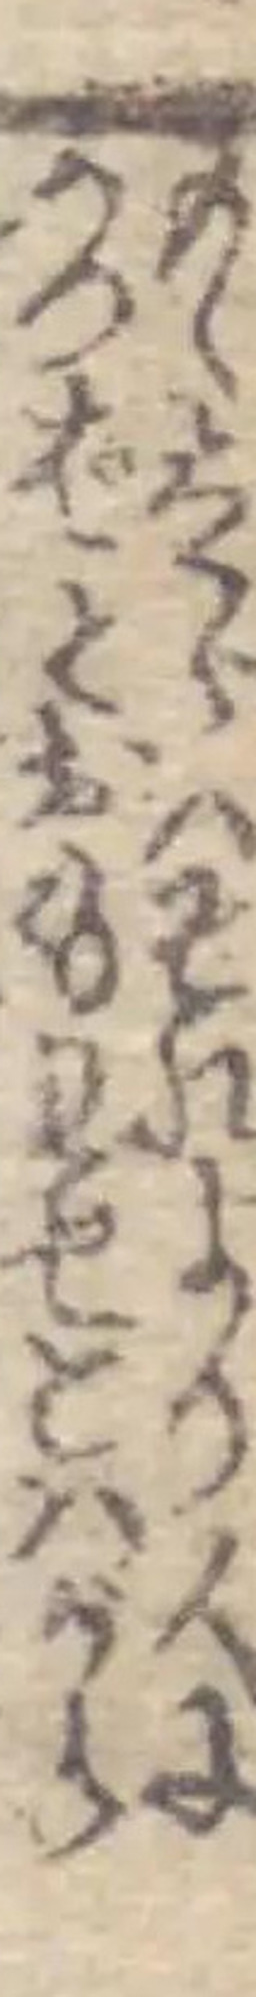かつぱとおもわせこはがら
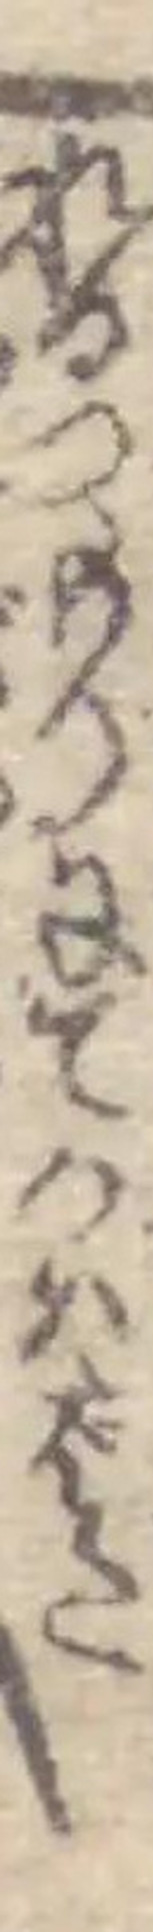れるつもりにてかはばた
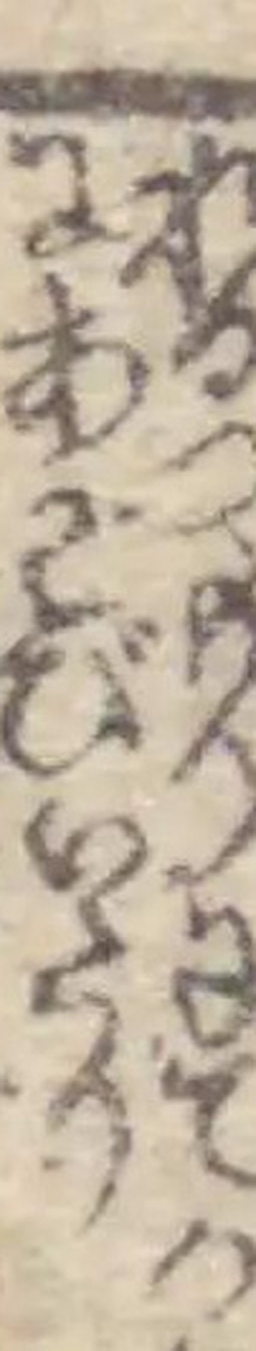にあそびいたり
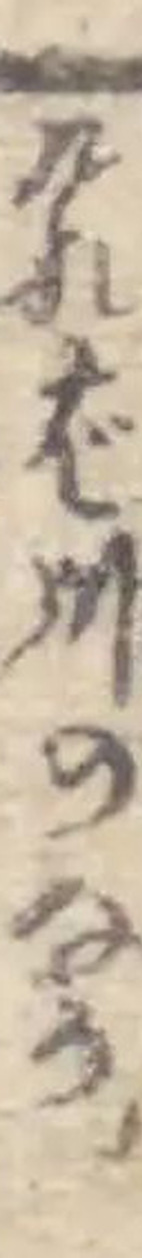ければ川のなか
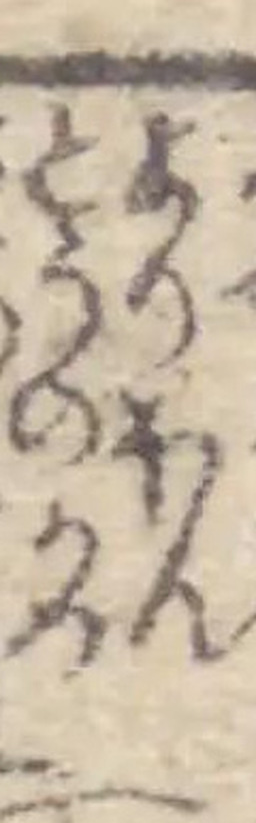とうのかつ
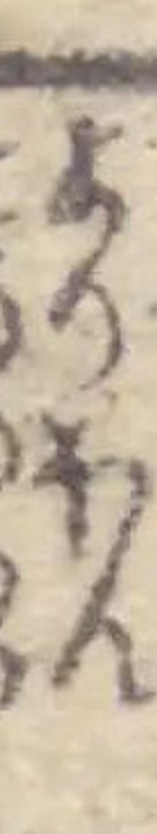よりほん
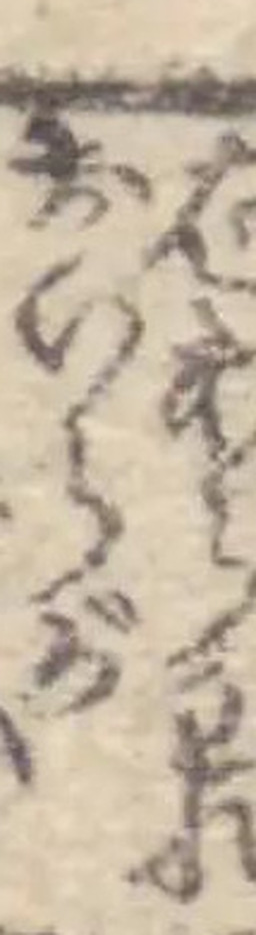おいらが
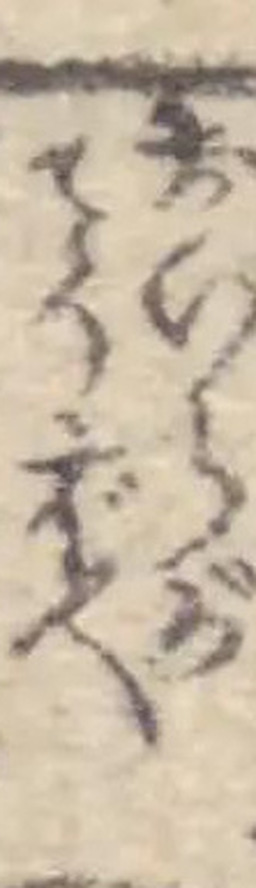てうばへ
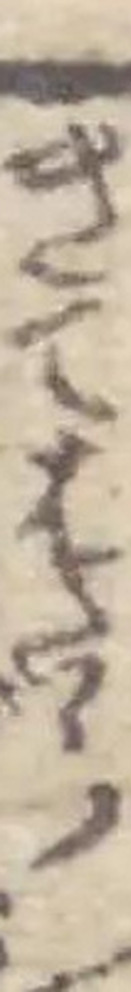きてはたら
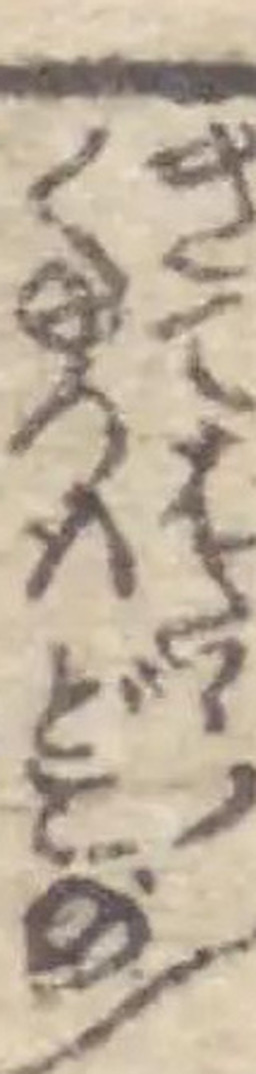くやつはどこの
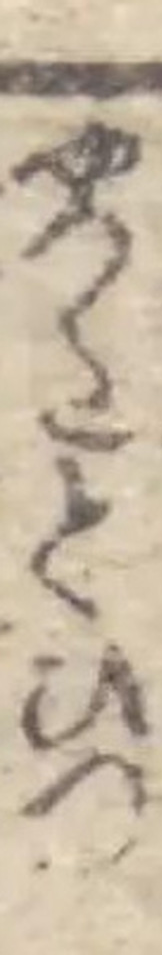やつたとひつ
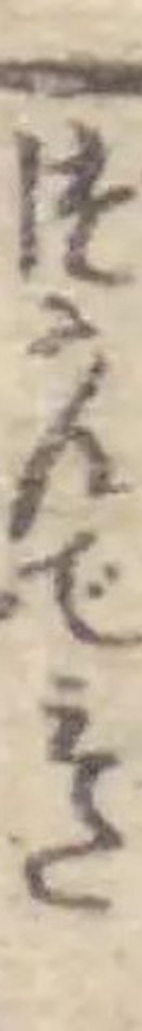つかんでみた
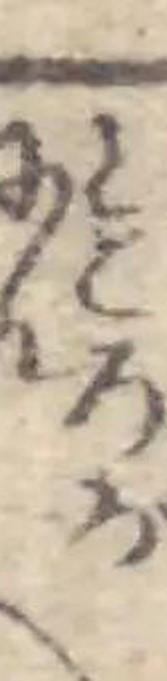ところが
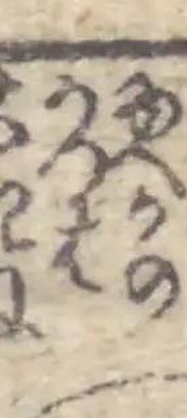ゆへかの
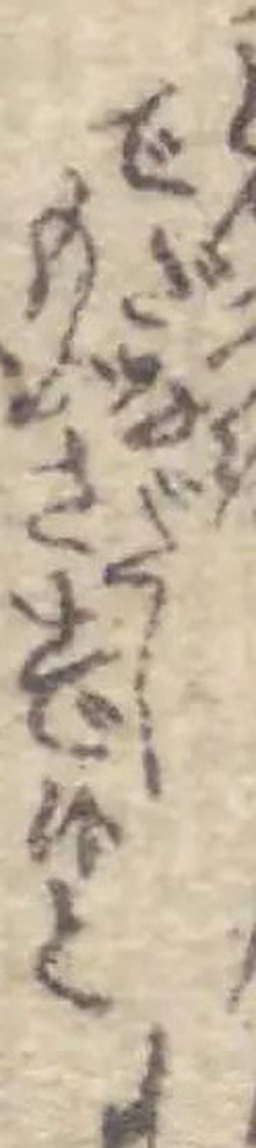もふさず候と
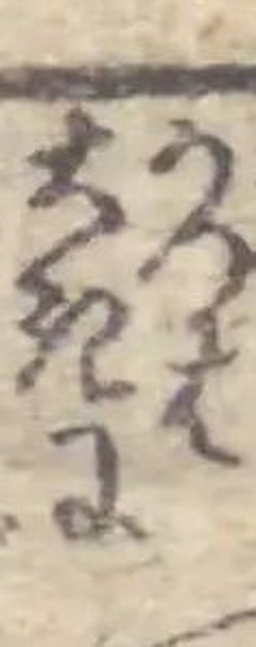大きに
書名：化物尽 4巻
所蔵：国立国会図書館 National Diet Library, JAPAN
